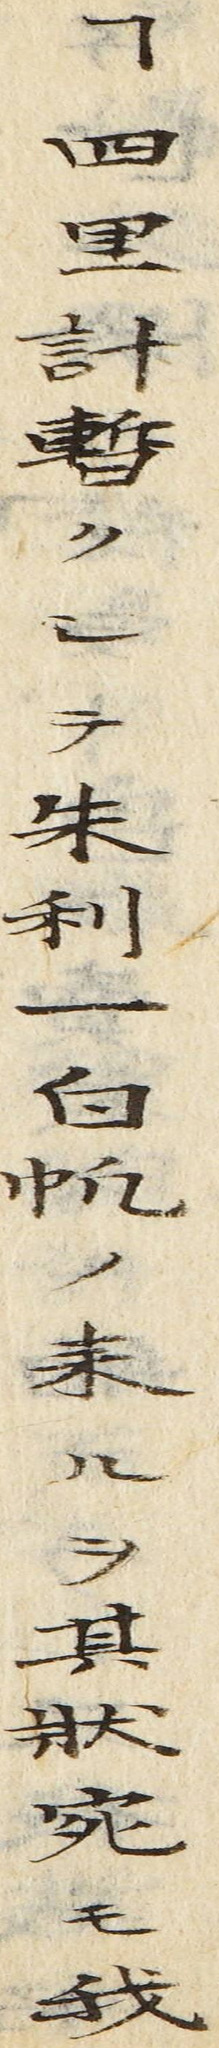コト四里計暫クシテ朱利一白帆ノ来ルヲ其状宛モ我
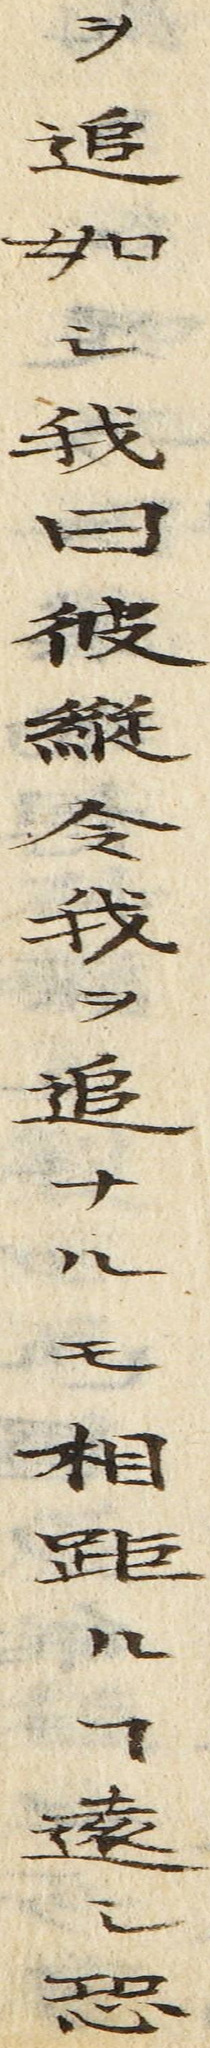ヲ追如シ我曰彼縦令我ヲ追ナルモ相距ルコト遠シ恐

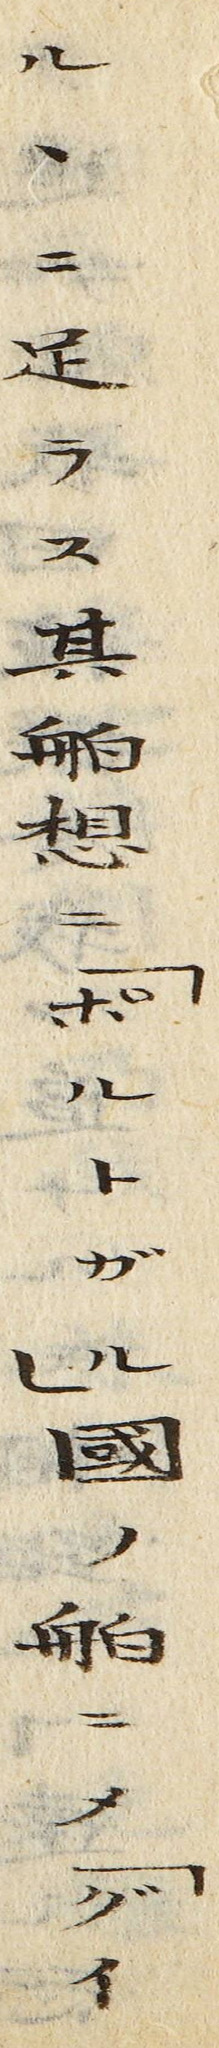ルヽニ足ラス其舶想ニ「ポルトガル」国ノ舶ニシテ「グイ
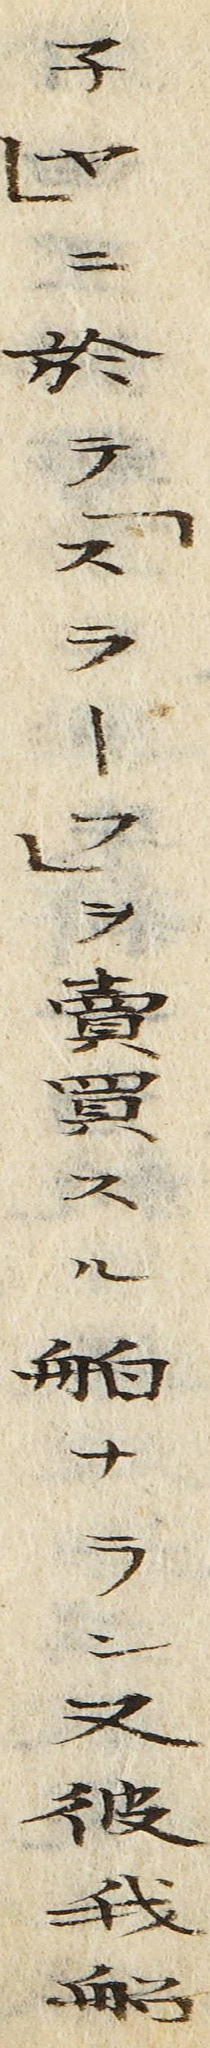ネヤ」ニ於テ「スラーフ」ヲ売買スル舶ナラン又彼我船
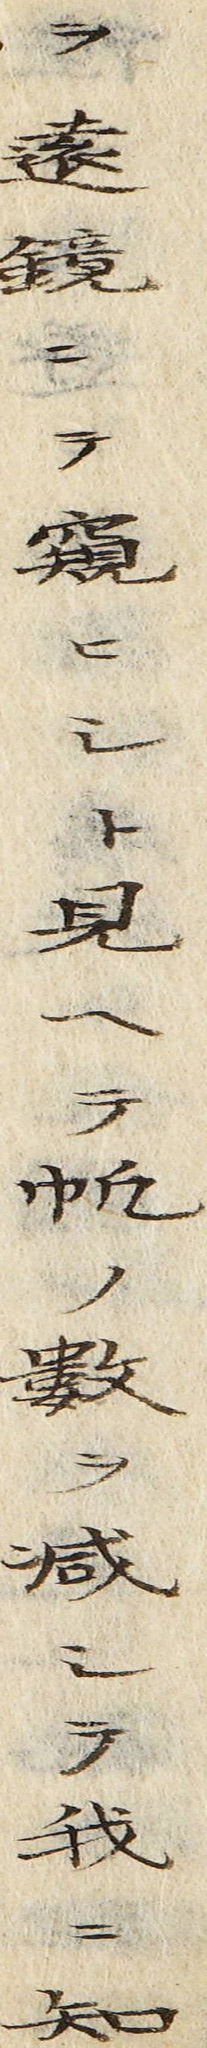ヲ遠鏡ニテ窺ヒシト見ヘテ帆ノ数ヲ減シテ我ニ知
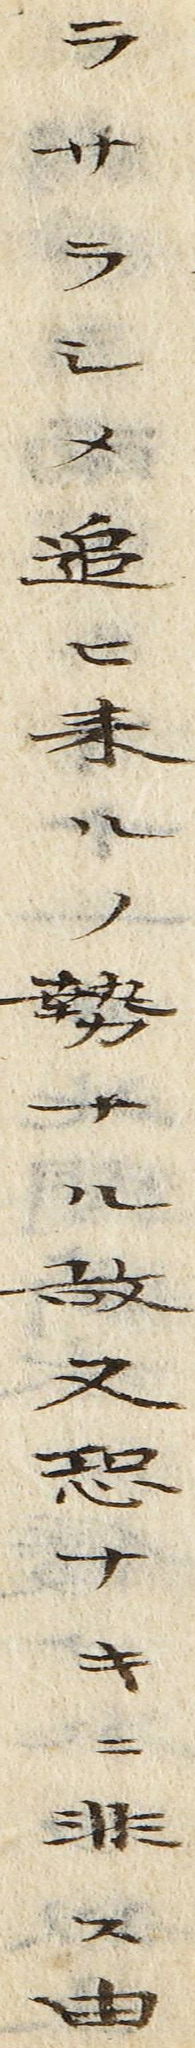ラサラシメ追ヒ来ルノ勢ナル故又恐ナキニ非す由
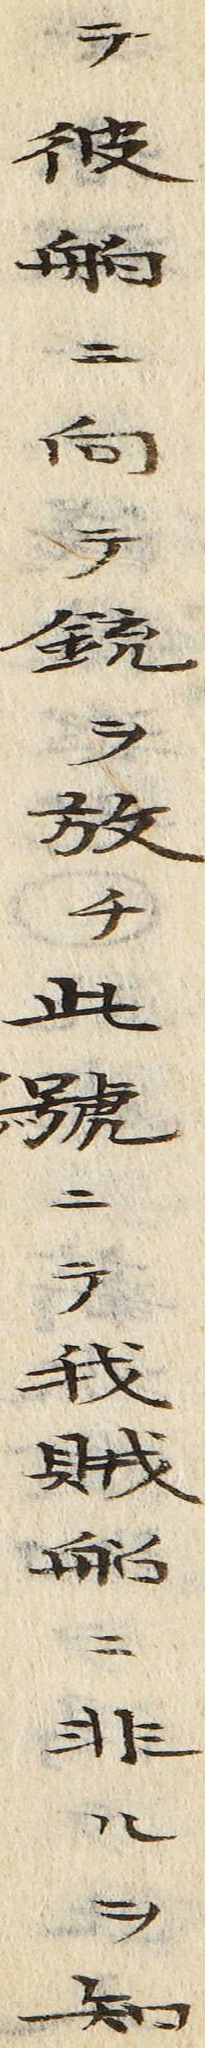テ彼舶ニ向テ銃ヲ放チ此号ニテ我賊船ニ非ルヲ知
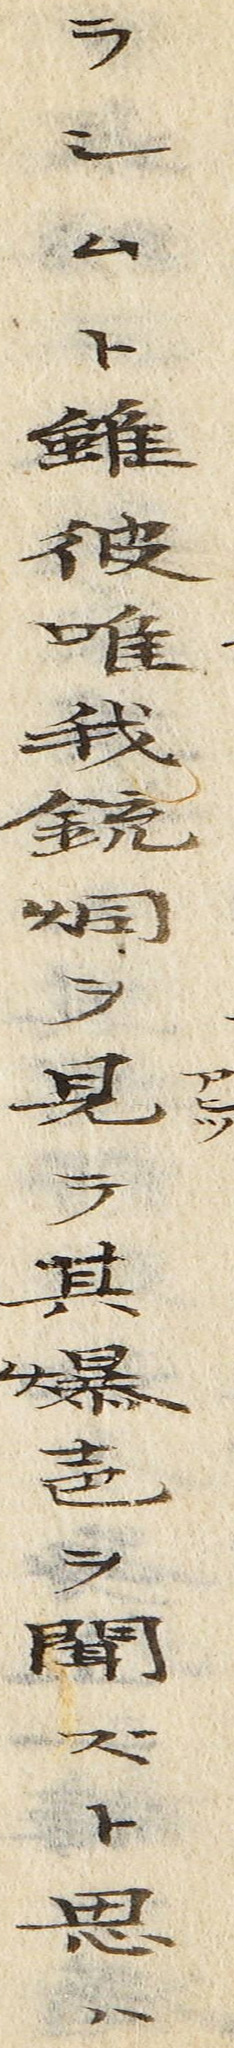ラシムト雖彼唯我銃煙ヲ見テ其爆声ヲ聞ズト思ハ
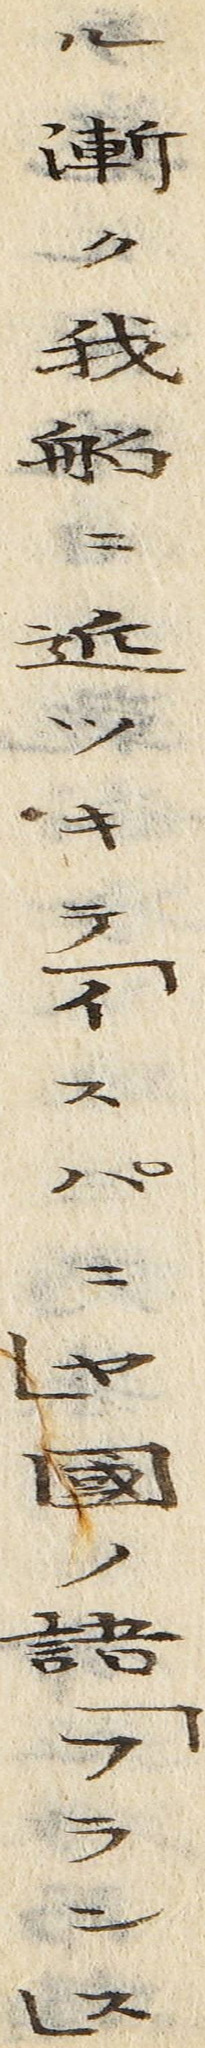ル漸ク我船ニ近ツキテ「イスパニヤ」国ノ語「フランス」
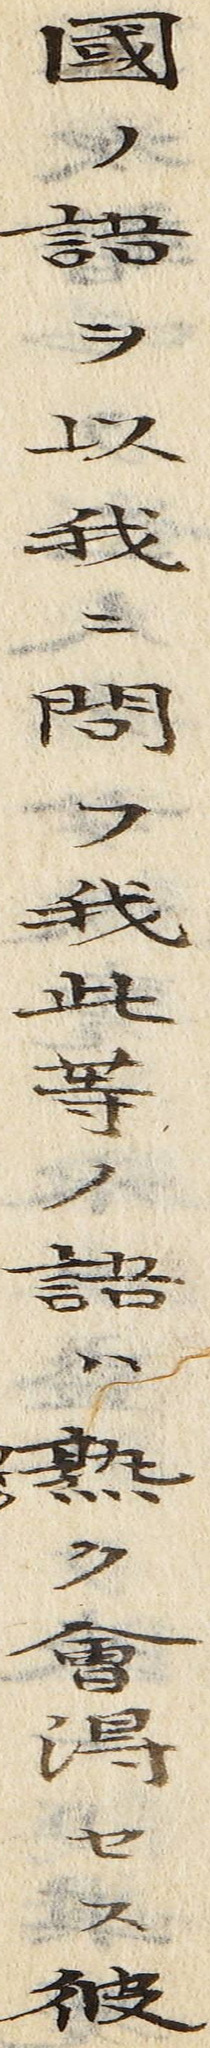国ノ語ヲ以我ニ問フ我此等ノ語ハ熟ク会得セス彼
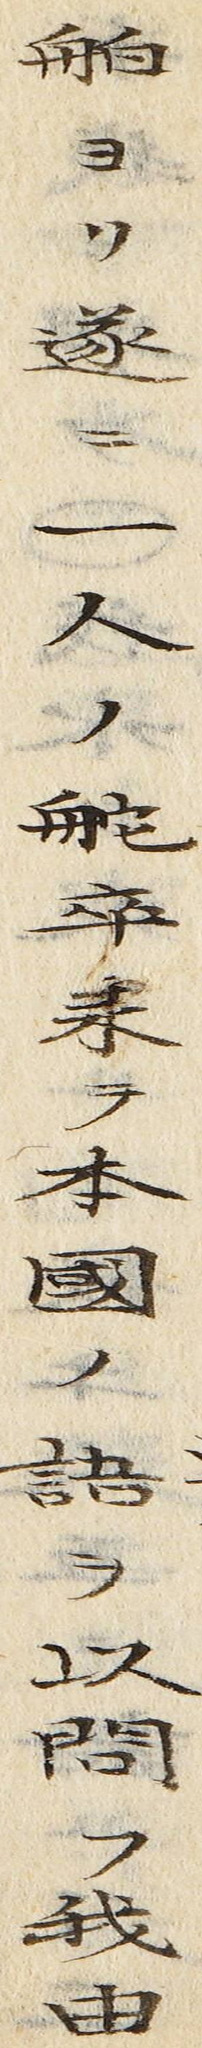舶ヨリ遂ニ一人ノ舵卒来テ本国ノ語ヲ以問フ我由
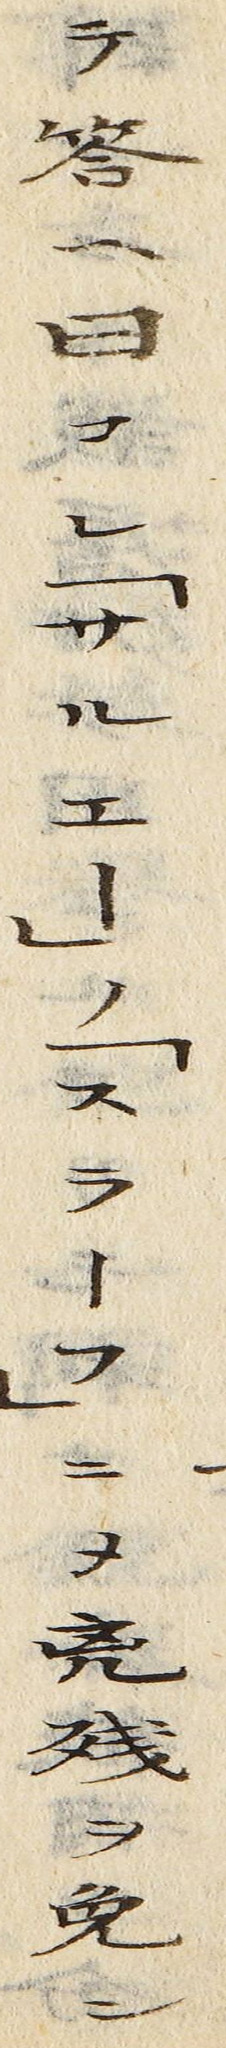テ答ヘ曰コレ「サルエー」ノ「スラーフ」ニシテ兇残ヲ免ン
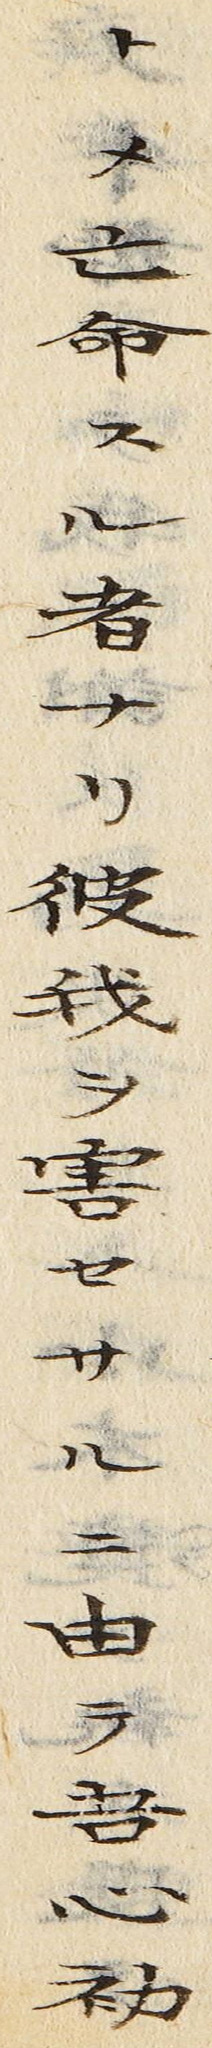トシテ亡命スル者ナリ彼我ヲ害セサルニ由テ吾心初
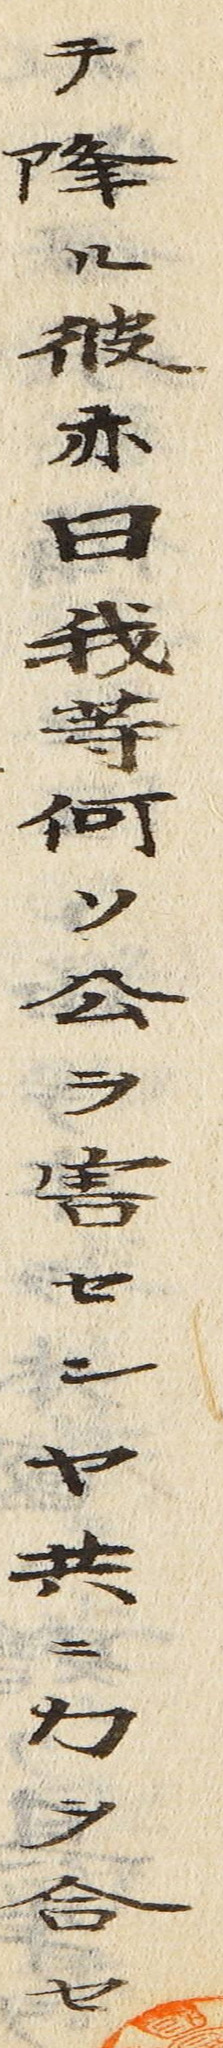テ降ル彼亦曰我等何ソ公ヲ害センヤ共ニ力ヲ合セ
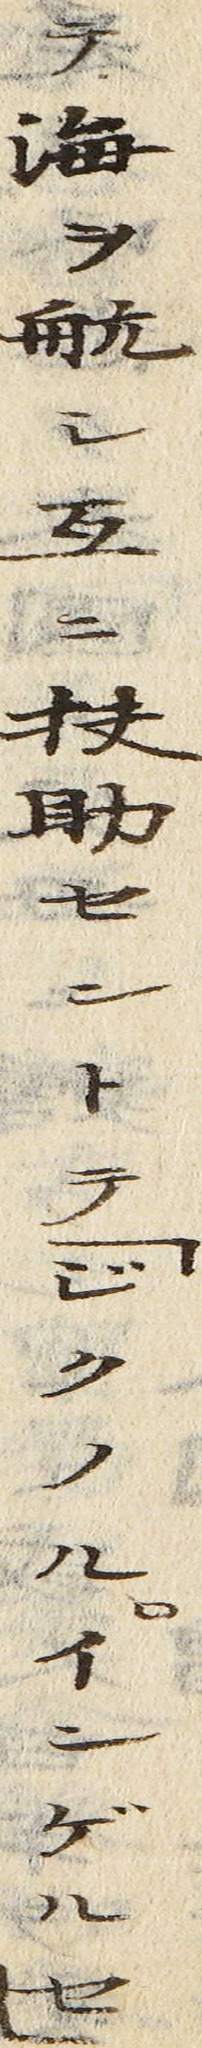テ海ヲ航シ互ニ扶助セントテ「ジクノル。インゲルセ」
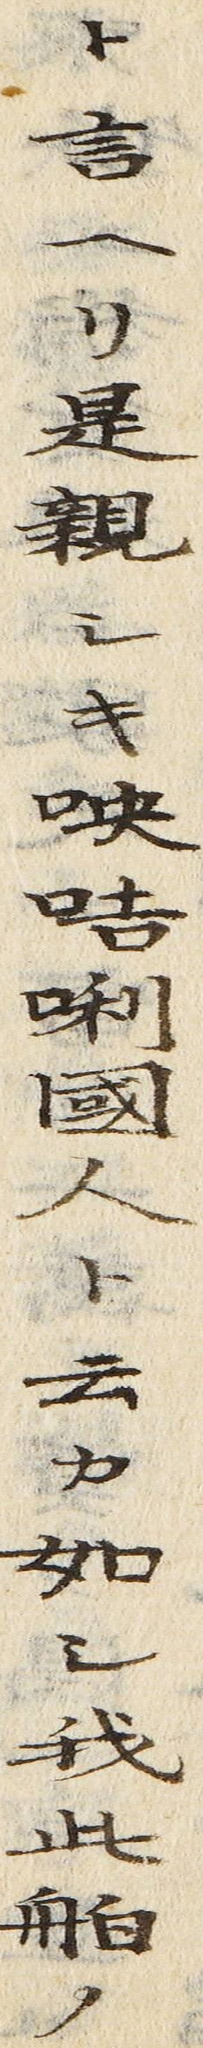ト言ヘリ是親シキ𠸄咭唎国人ト云カ如シ我此舶ノ
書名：漂流紀事
